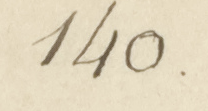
140.
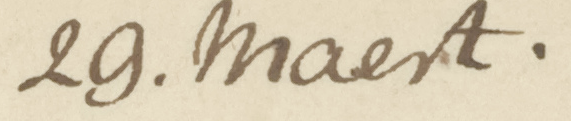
29. Maert.
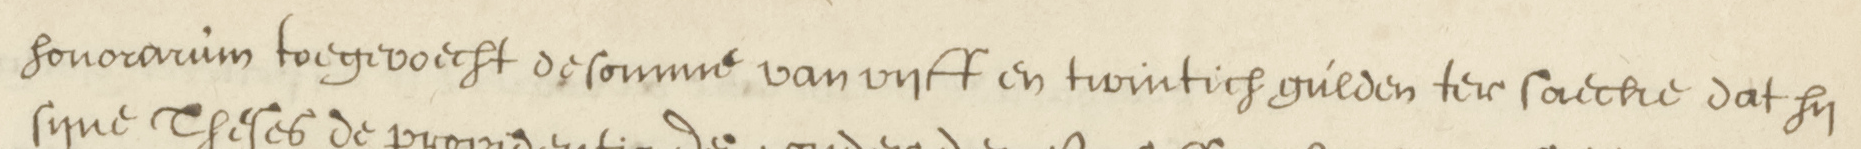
honorarum toegevoecht de somme van vyff en twintich gulden ter saecke dat hy
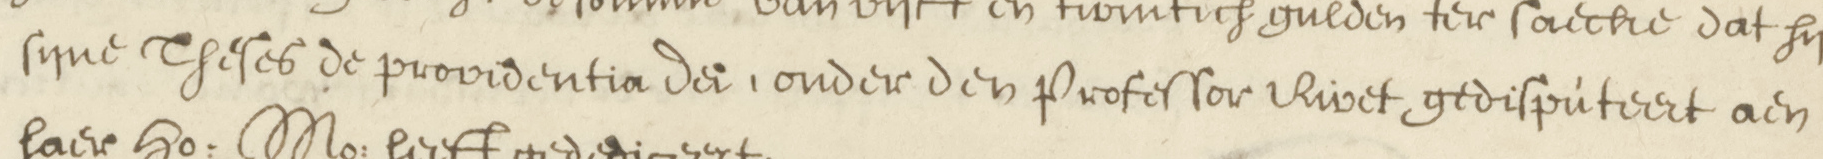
syne Theses de providentia dei, onder den Professor Rivet gedisputeert aen
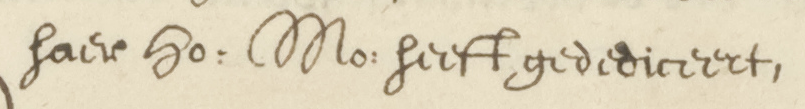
haer Ho:Mo: heeft gedediceert.
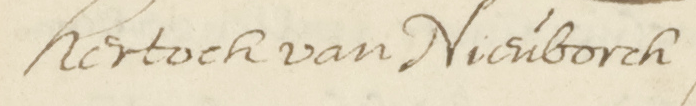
hertoch van Nieuborch
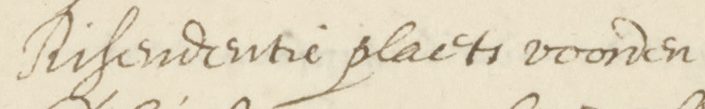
Risendentie plaets voorden
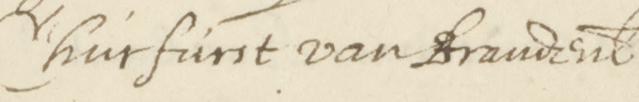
Churfurst van Brandenb
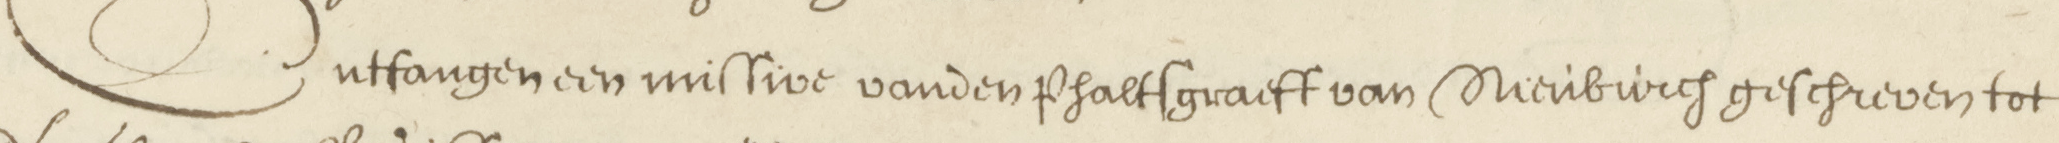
Ontfangen een missive vanden Phaltsgraeff van Nieuburch geschreven tot
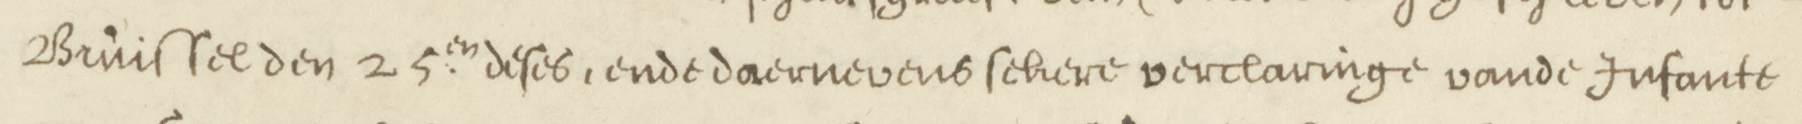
Bruissel den 25en. deses, ende daernevens sekere verclaringe vande Infante
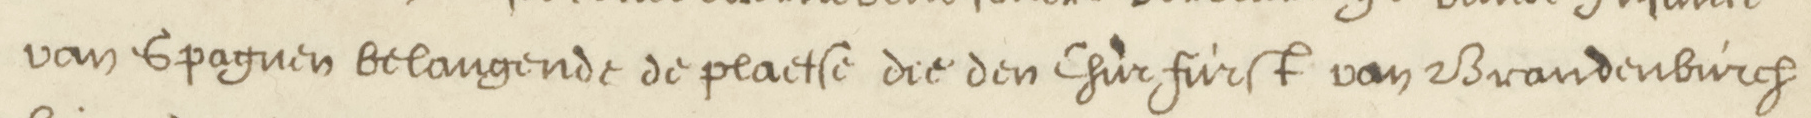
van Spagnen belangende de plaetse die den Churfurst van Brandenburch
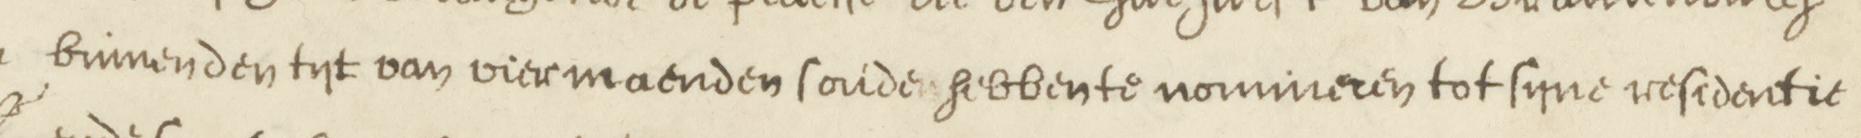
binnen den tyt van vier maenden souden hebben te nomineren tot syne residentie
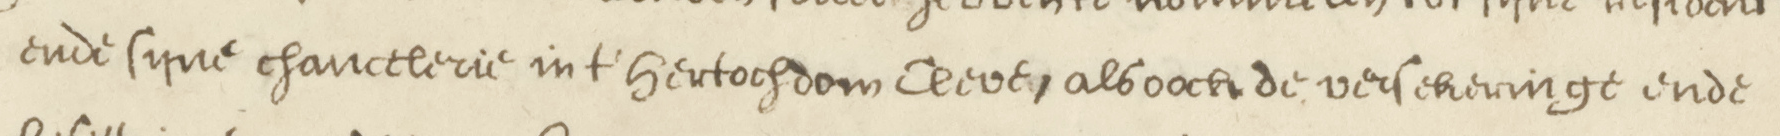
ende syne chancelerie in t'Hertochdom Cleve, als oock de versekeringe ende
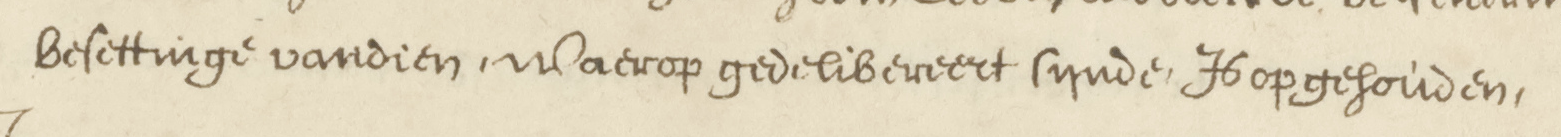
besettinge vandien. Waerop gedelibereert synde, Is opgehouden.
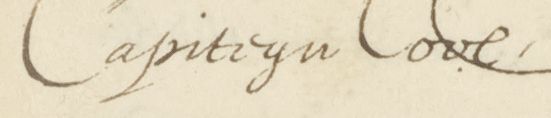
Capiteyn Cool
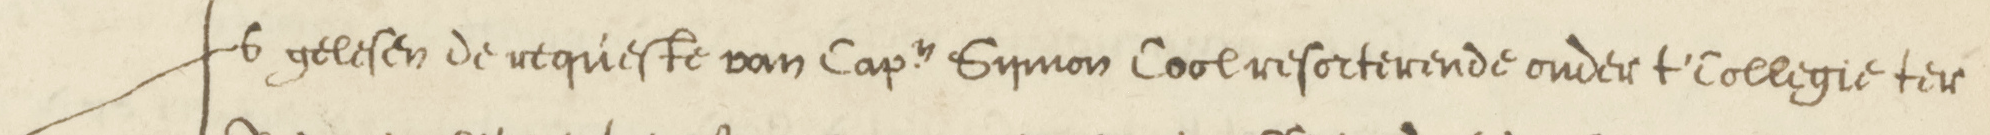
Is gelesen de requeste van Capn. Symon Cool resorterende onder t'Collegie ter
